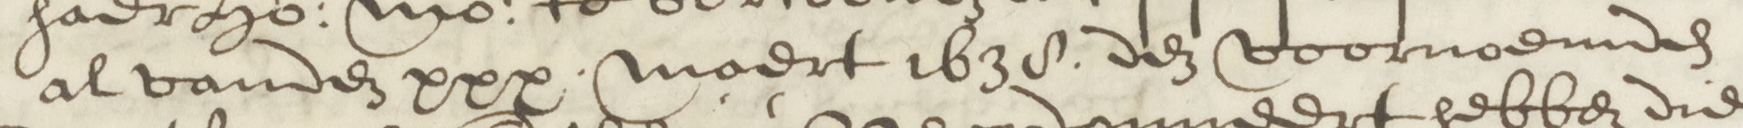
al vanden xxx. maert 1638 den voornoemden
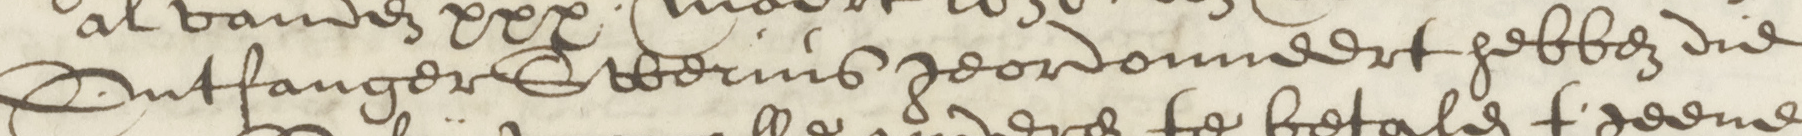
Ontfanger Swerius geordonneert hebben die
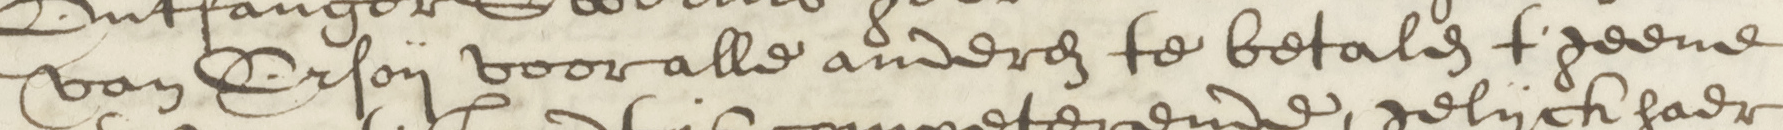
van Orsoij voor alle anderen te betalen, t'geene
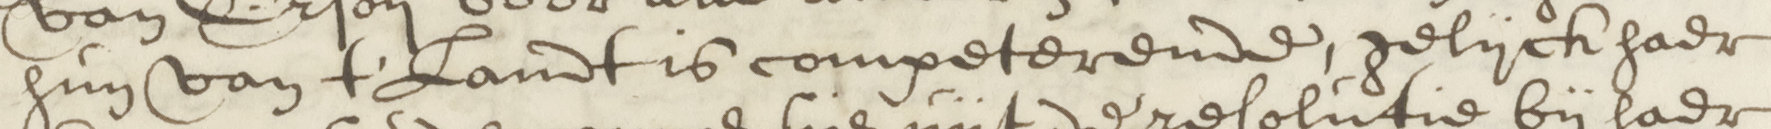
hun van t'Landt is competerende, gelijck haer
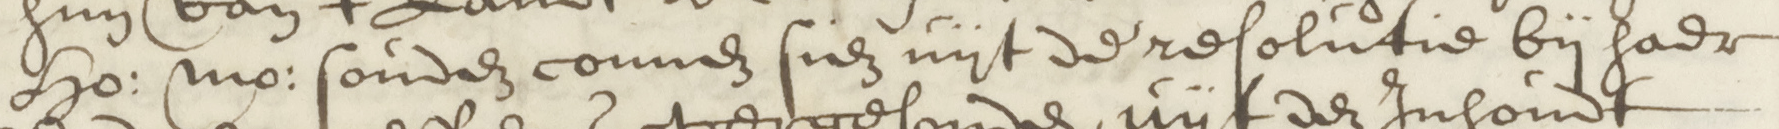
Ho:Mo: souden connen sien uijt de resolutie bij haer
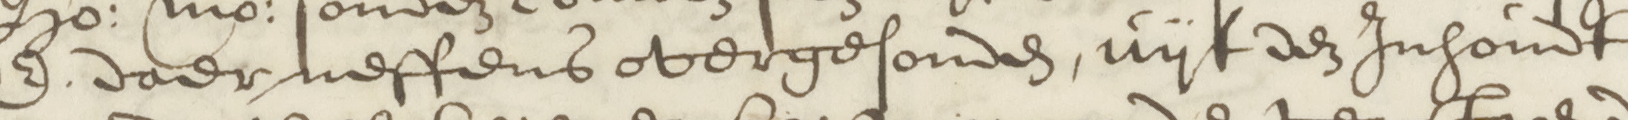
E. daer neffens overgesonden, uijt den Inhoudt
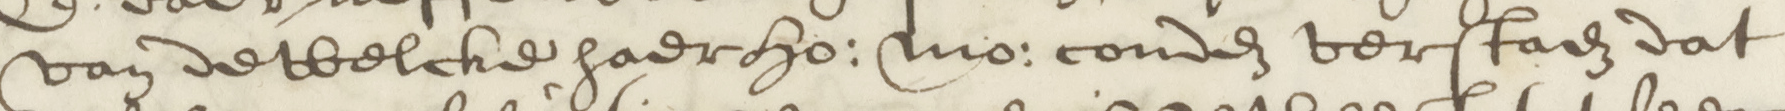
van dewelcke haer Ho:Mo: conden verstaen dat
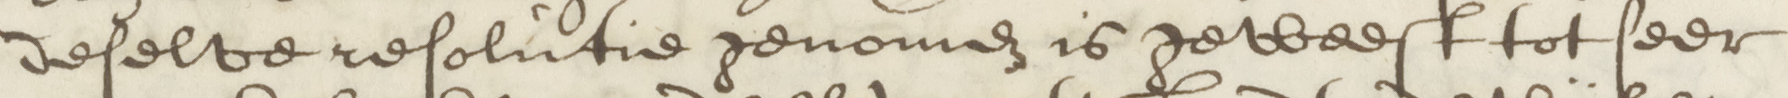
deselve resolutie genomen is geweest tot seer
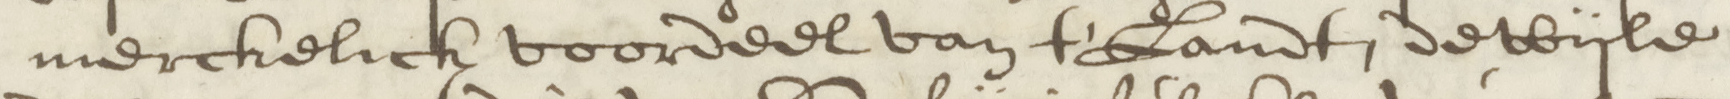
merckelick voordeel van t'Landt, dewijle
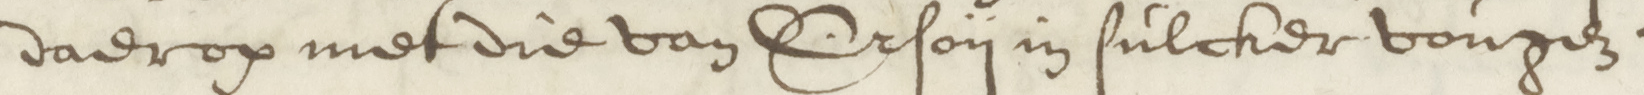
daerop met die van Orsoij sulcker vougen
